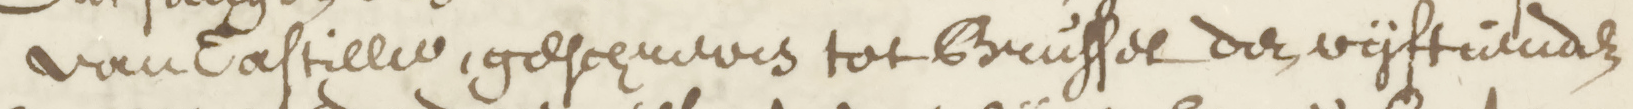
van Castille, geschreven tot Brussel den vijftienden
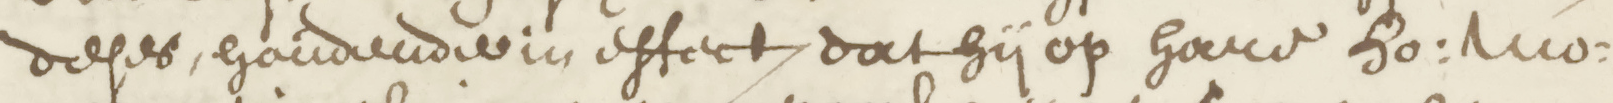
deses, houdende in effect, dat hij op hare ho:mo:
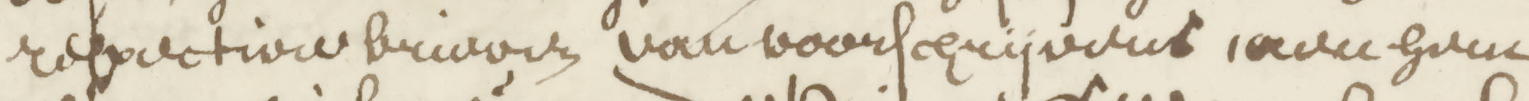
respective brieven van voorschrijvens, aen hem
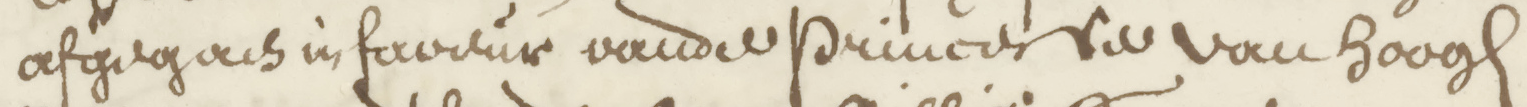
afgegaen in faveur vande Princesse van hoogh
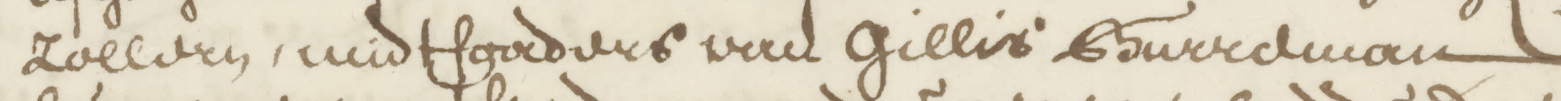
zollern, midtsgaders van Gillis Burreman
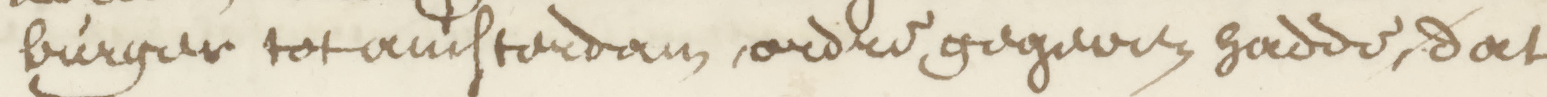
burger tot amsterdam, ordre gegeven hadde, dat
